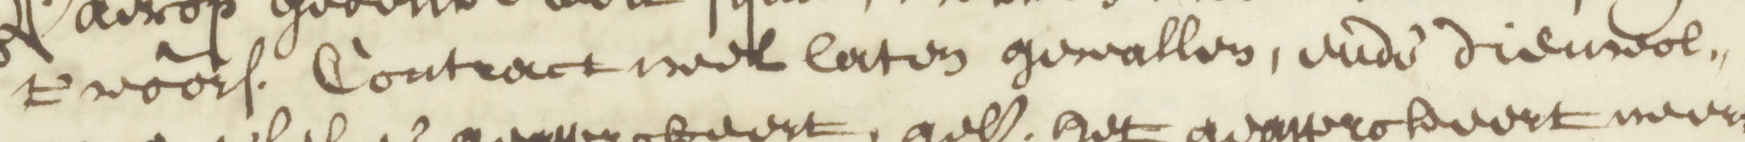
t' voors. contract wel laten gevallen ende dienvol„
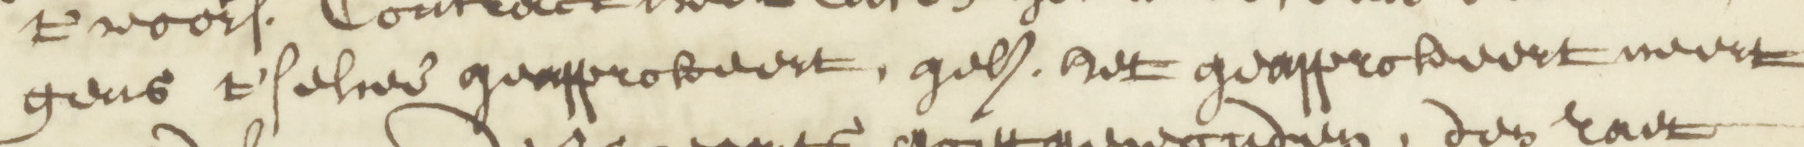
gens t' selve geapprobeert, gel. het geapprobeert wert
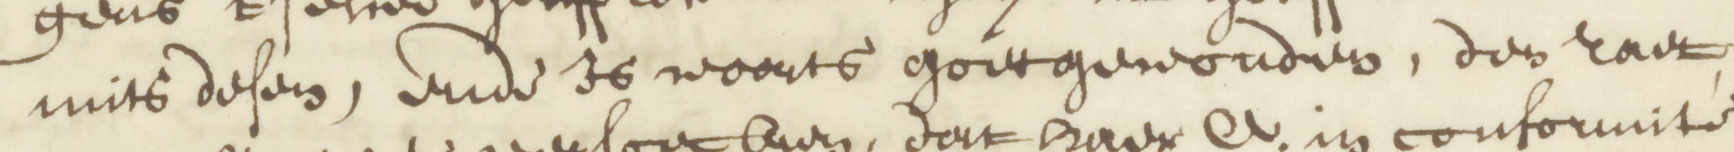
mits desen, ende is voorts goetgevonden, den raet
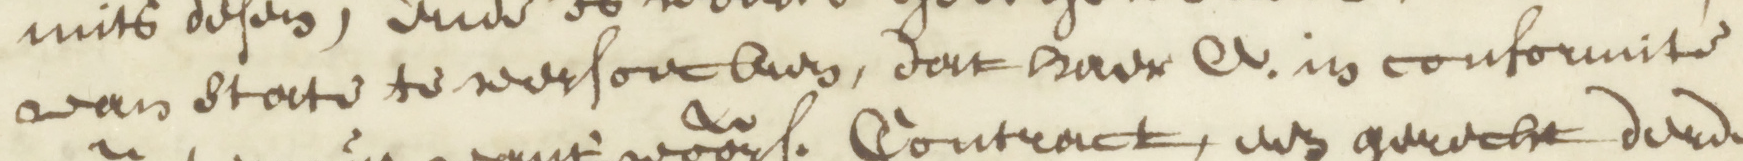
van state te versoecken dat Haer E. in confirmite
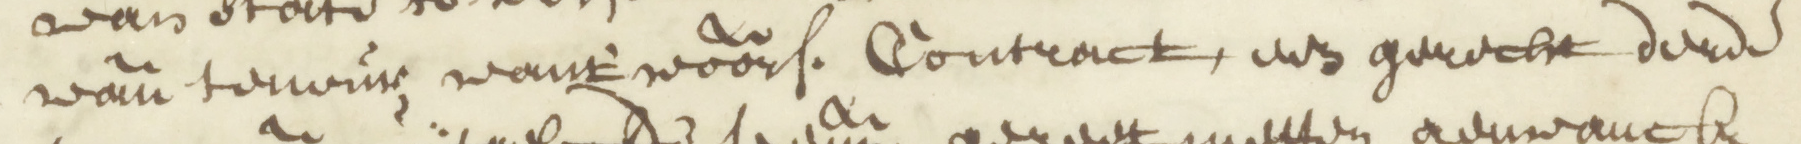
van teneur vant' voors. Contract, een gerecht derde
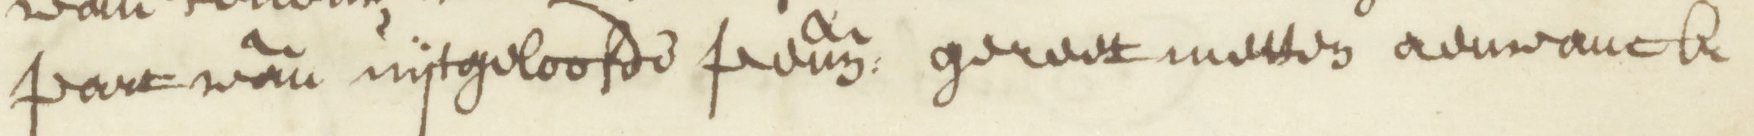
part van uijtgeloofde penn. gereet metten aenvanck
